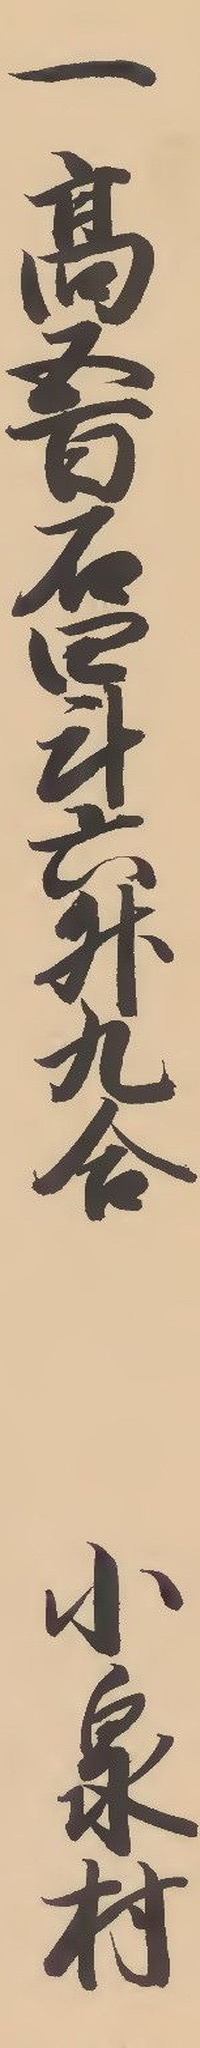一高五百石四斗六升九合小泉村
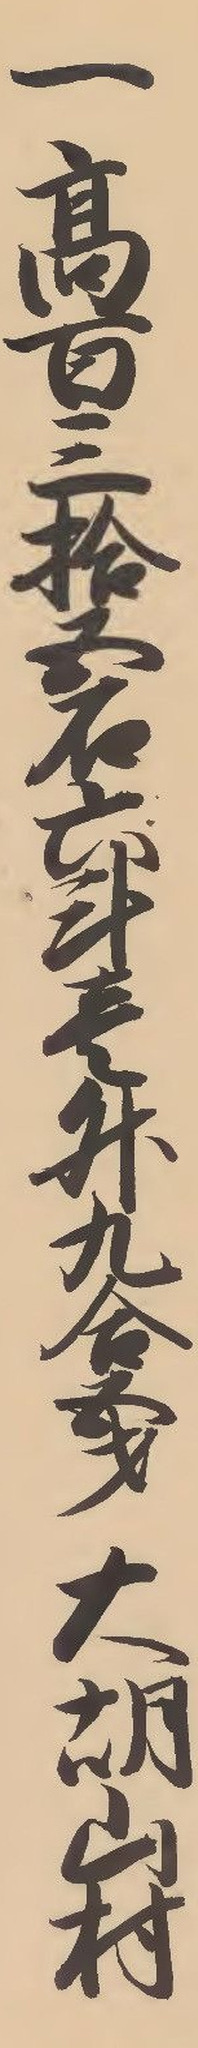一高百三拾五石六斗壱升九合五勺大胡山村
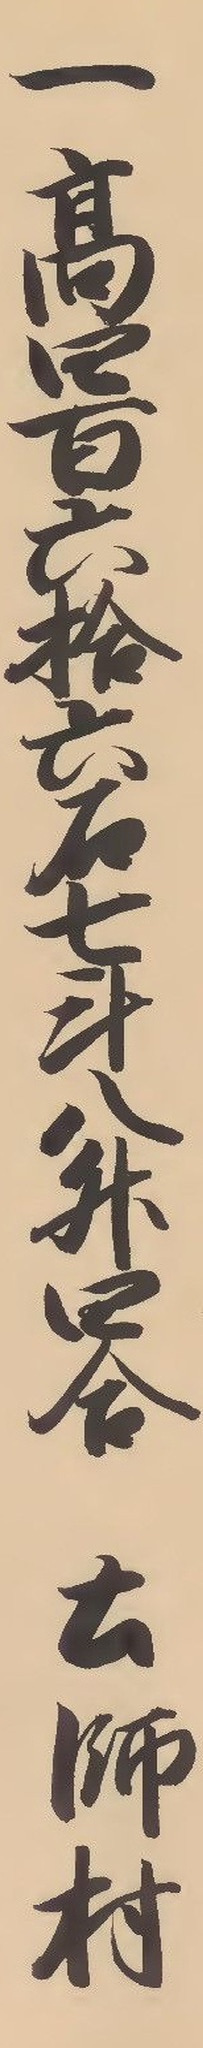一高四百六拾六石七斗八升四合土師村
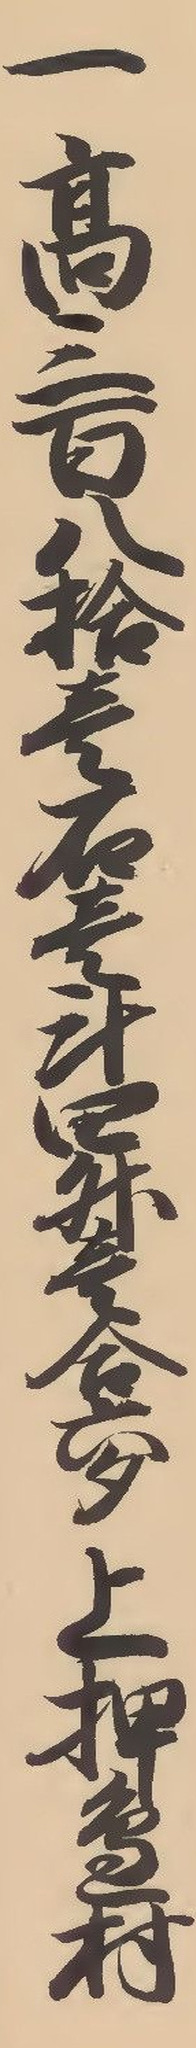一高三百八拾壱石壱斗四升壱合六勺上押辺村
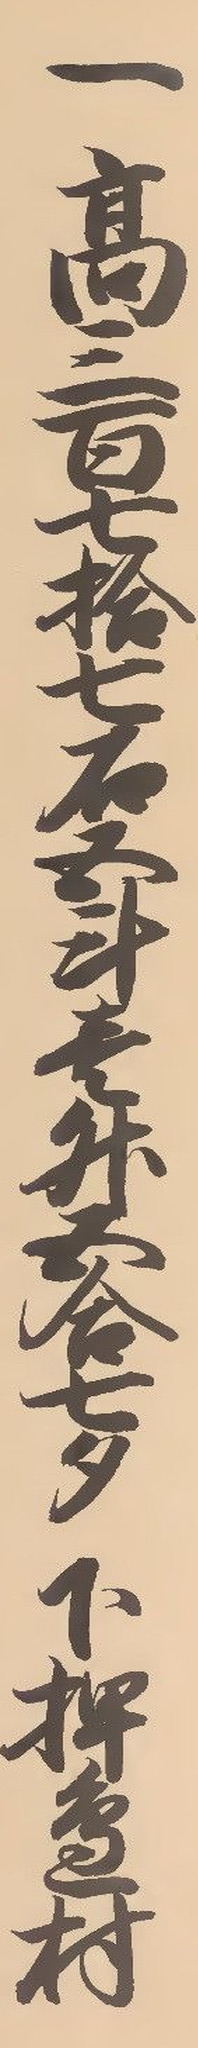一高三百七拾七石五斗壱升五合七勺下押辺村
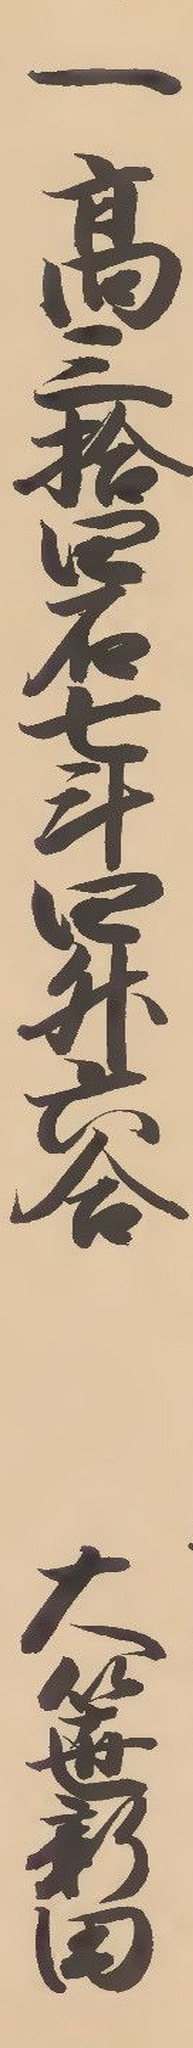一高三拾四石七斗四升六合大笹新田
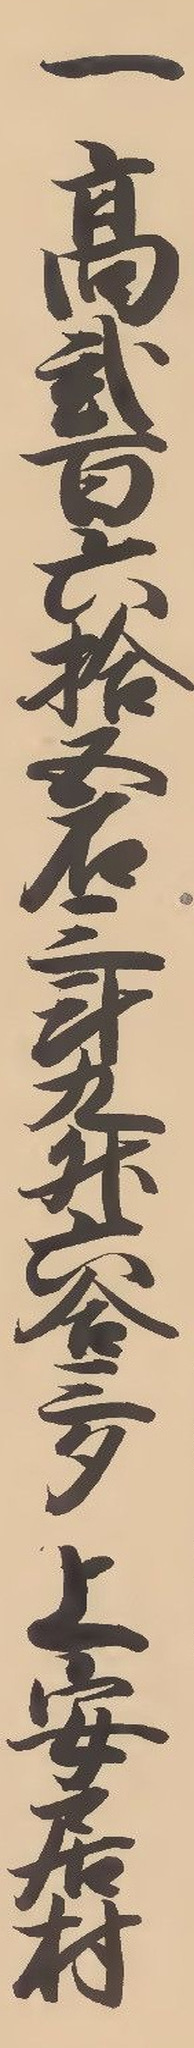一高弐百六拾五右三斗九升六合三勺上安居村

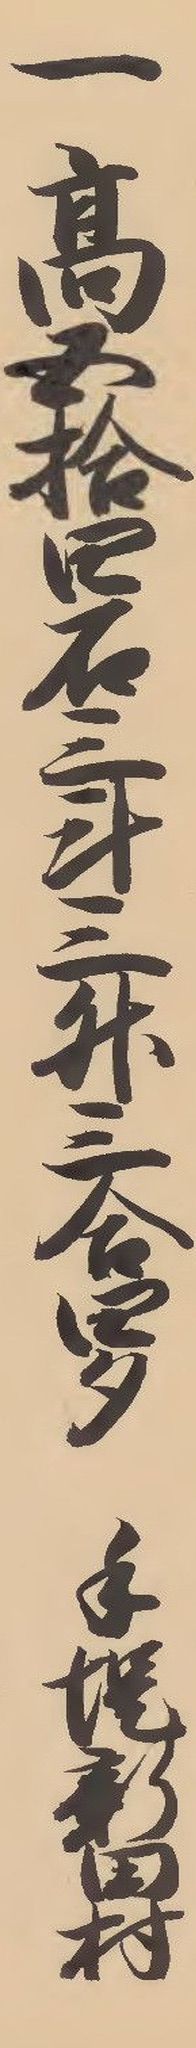一高五拾四石三斗三升三合四勺手堤新田村
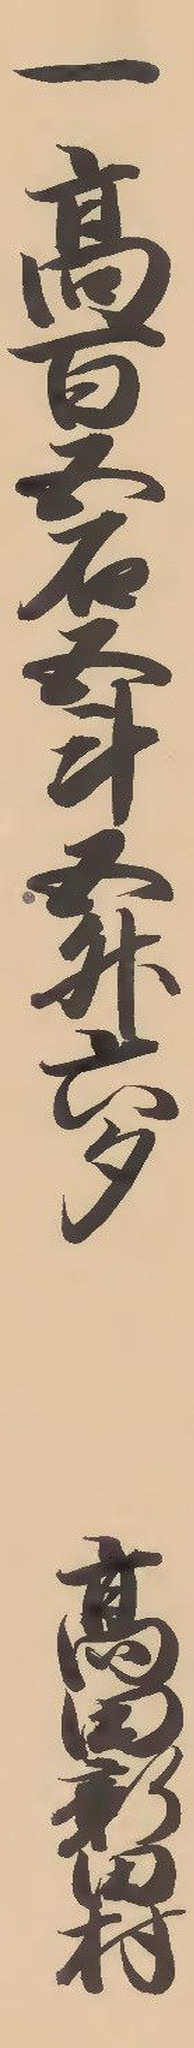一高百五石五斗五升六勺高田新田村
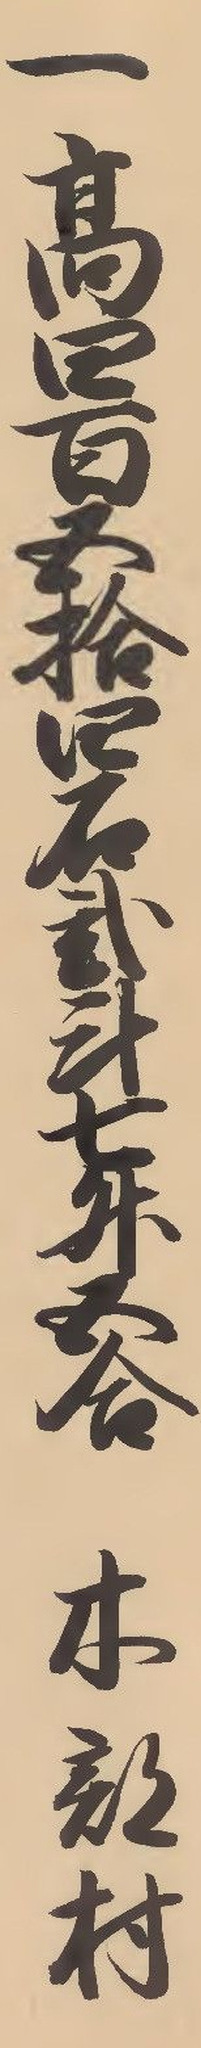一高四百五拾四石弐斗七升五合木部村
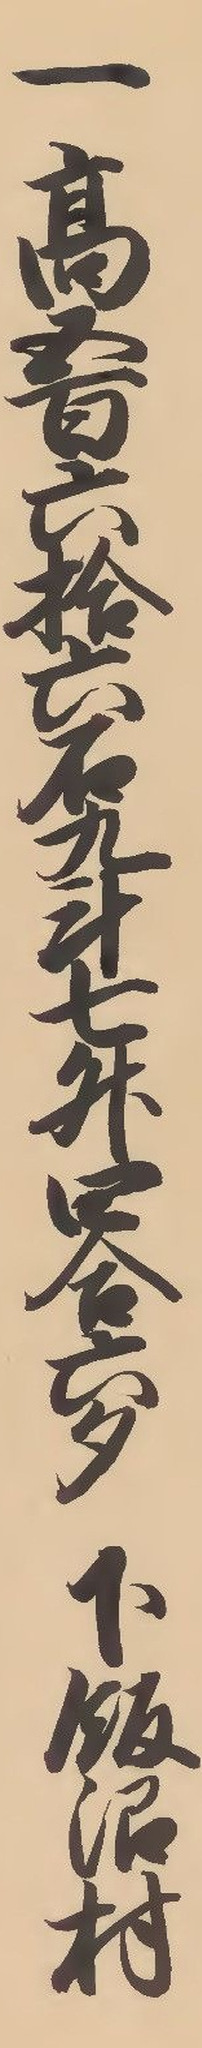一高五百六拾六石九斗七升四合六勺下飯沼村
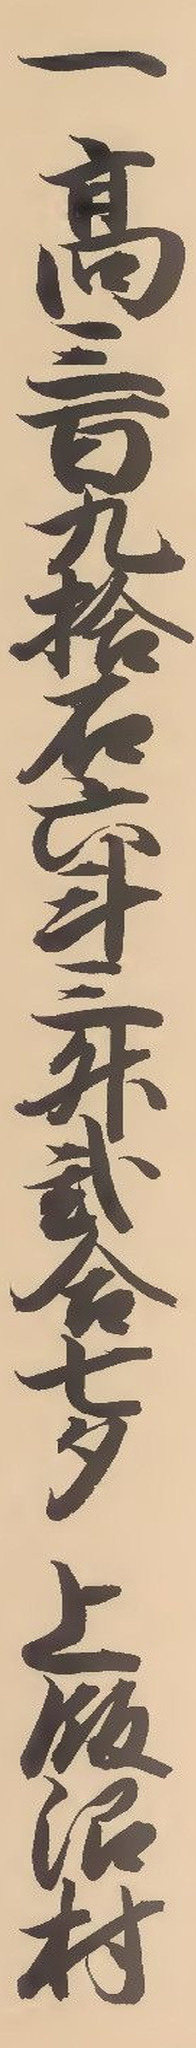一高三百九拾石六斗三升弐合七勺上飯沼村
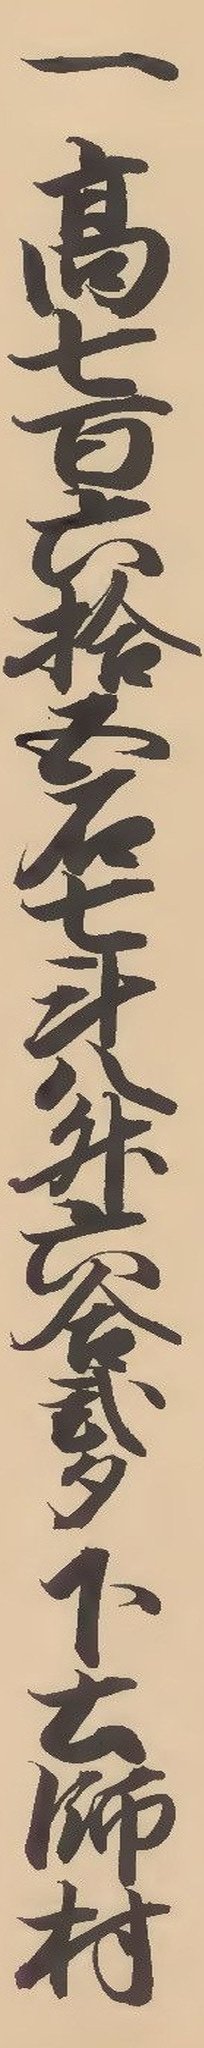一高七百六拾五石七斗八升六合弐勺下土師村
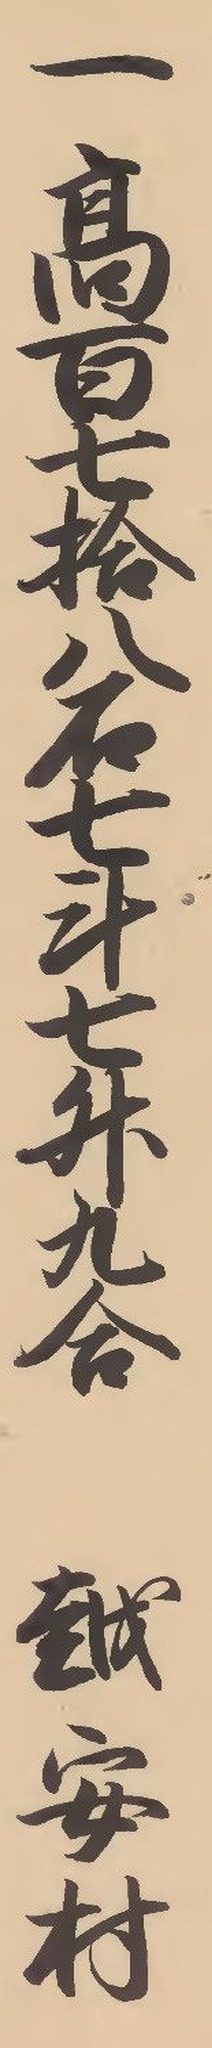一高百七拾八石七斗七升九合越安村
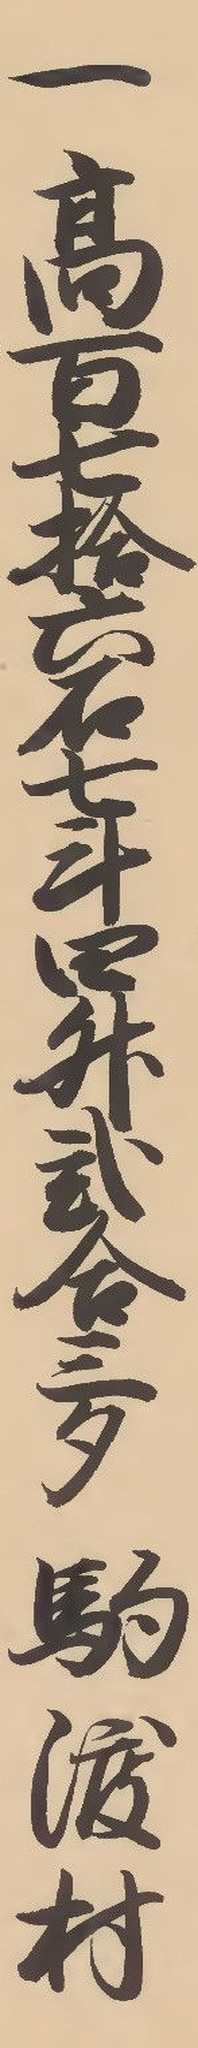一高百七拾六石七斗四升弐合三勺駒渡村

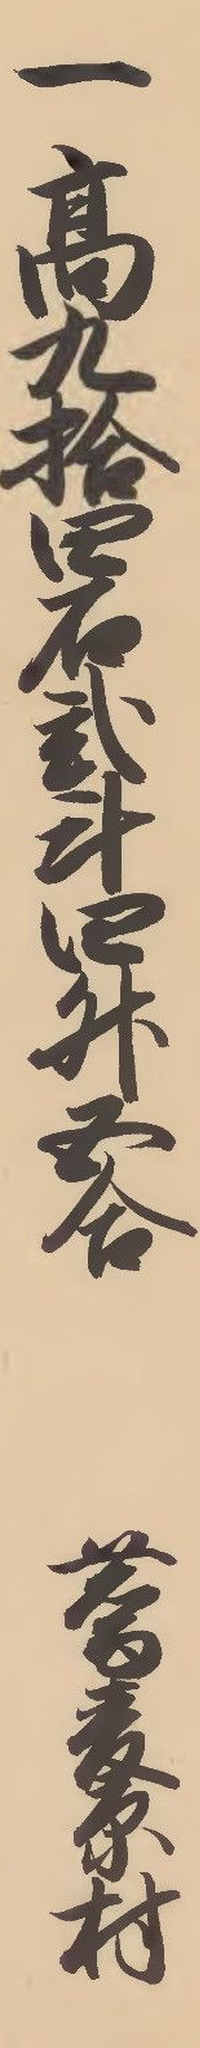一高九拾四石弐斗四升五合蕎麦原村
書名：常陸国郷帳
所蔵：国立公文書館 National Archives of Japan
